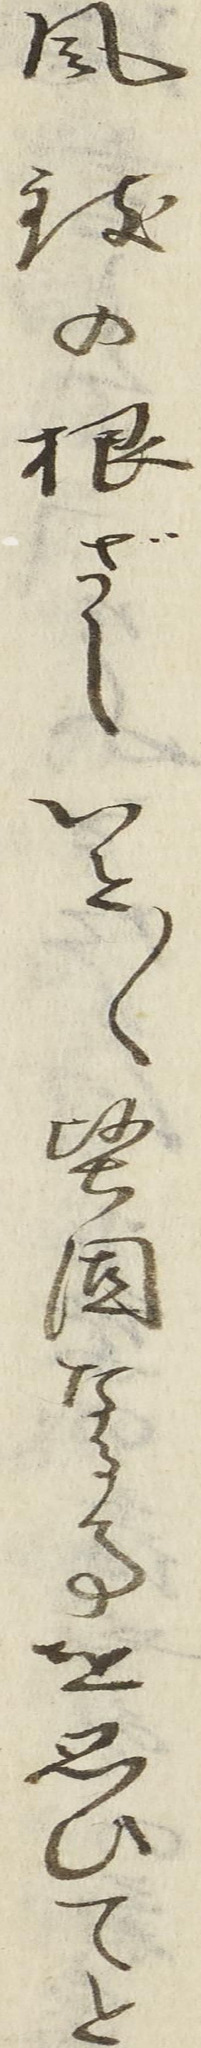風致の根ざしいと〳〵堅固なる事を思ひてと

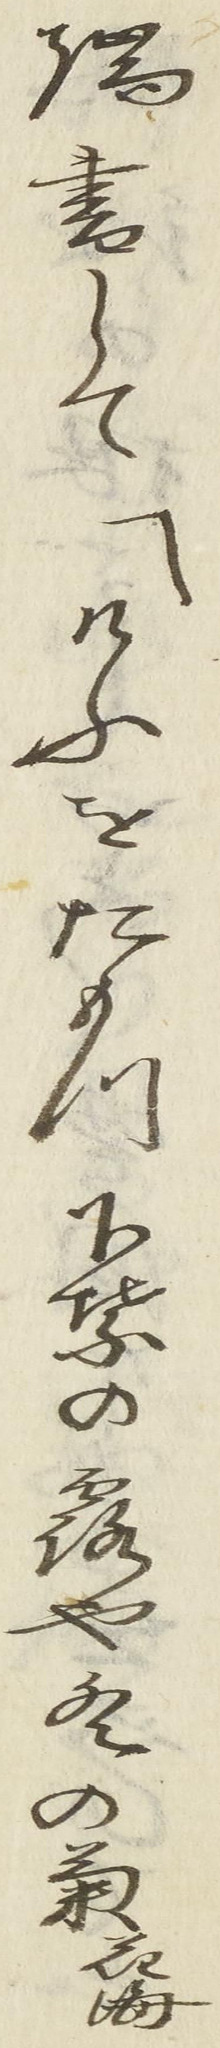端書して〽けふをたもつ下葉の露や冬の菊花海
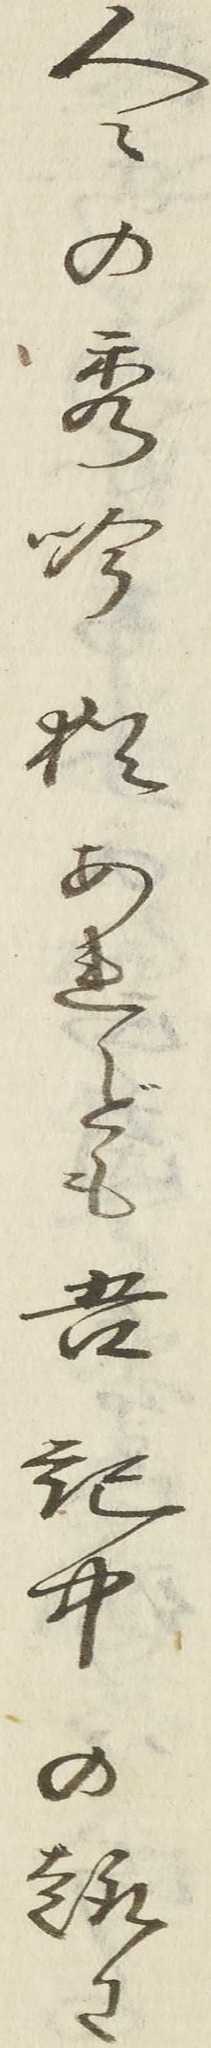人〻の秀吟猶あれども吾記中の趣に
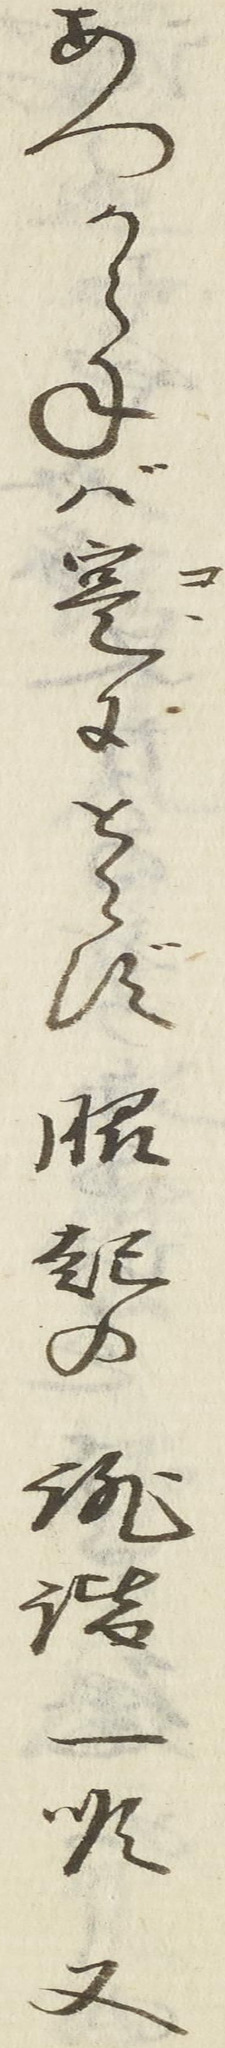あつからねば寔にとらず脇起の誹諧一順又
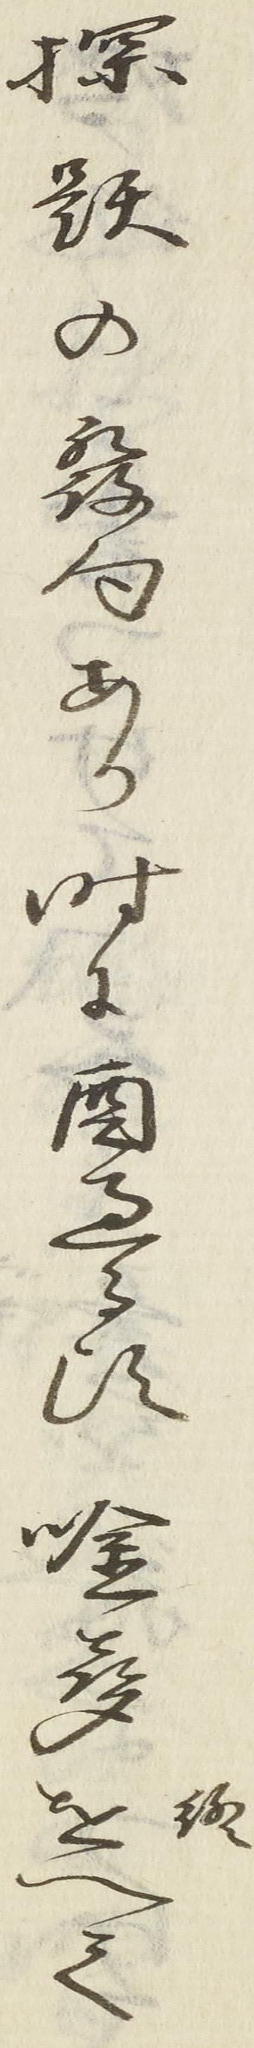探題の発句あり時に酉過る頃唫声をへ終て
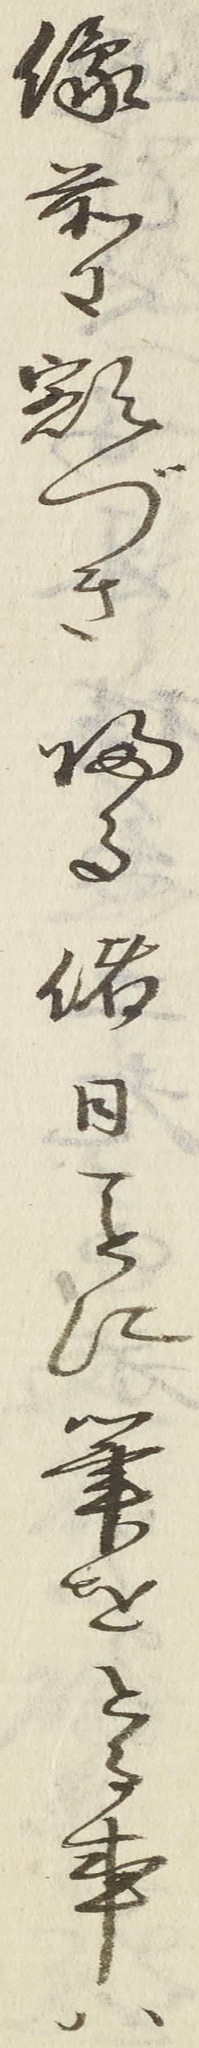像前に額づき帰る偖日ことに筆をとる事は
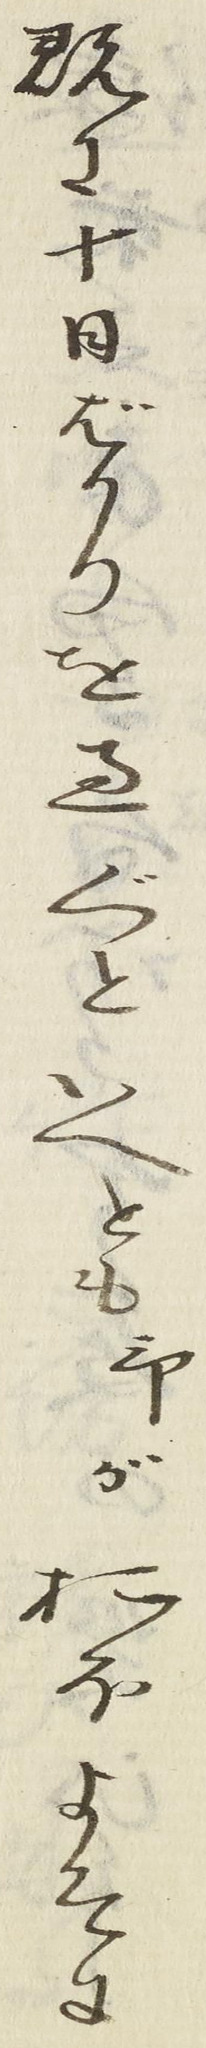既に十日ばかりを過ぐといへども予がおほよそに
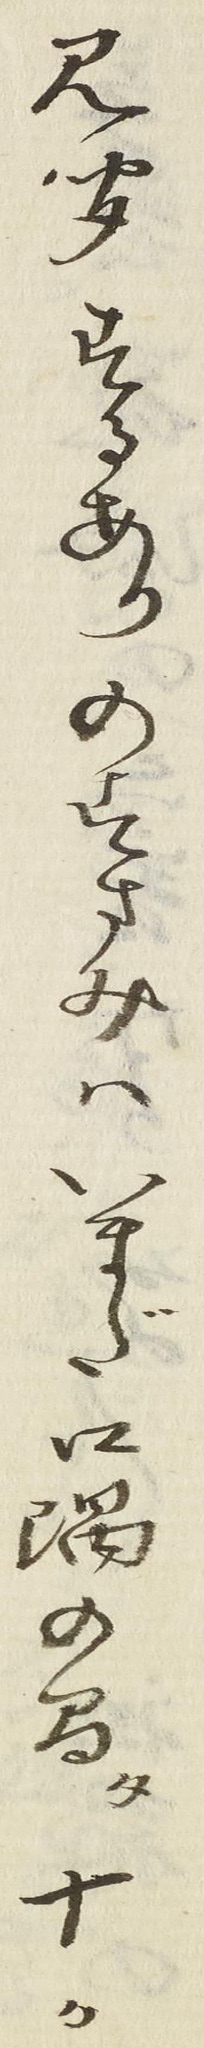見聞するありのすさみはいまだ口隅の間十か
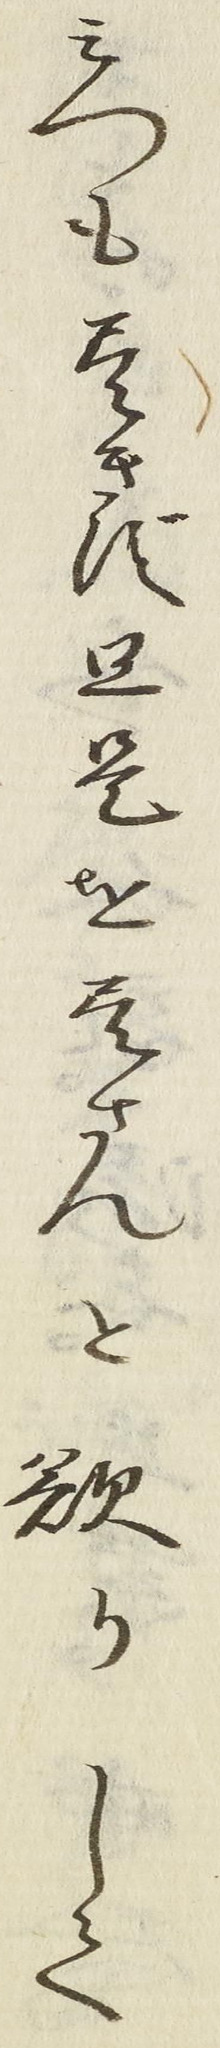みつも尽きず且是を尽さんと欲りして
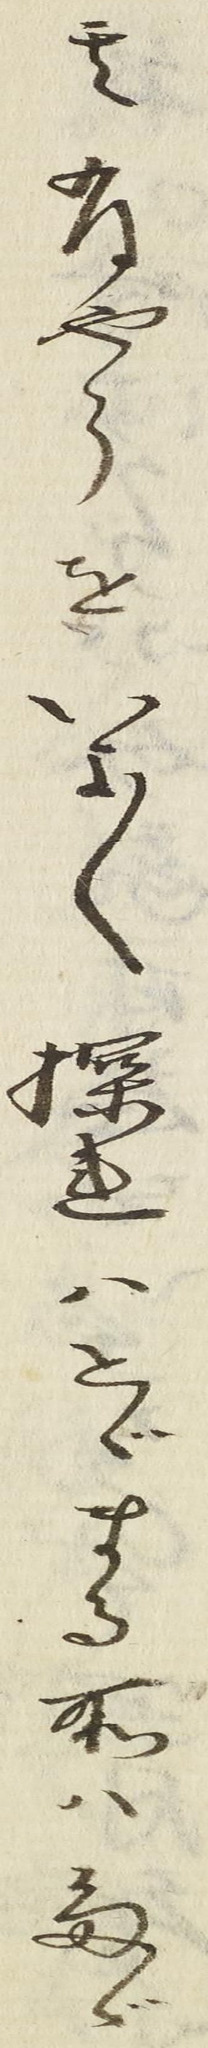其有やうをいよ〳〵探れはとゞまる所はたゞ
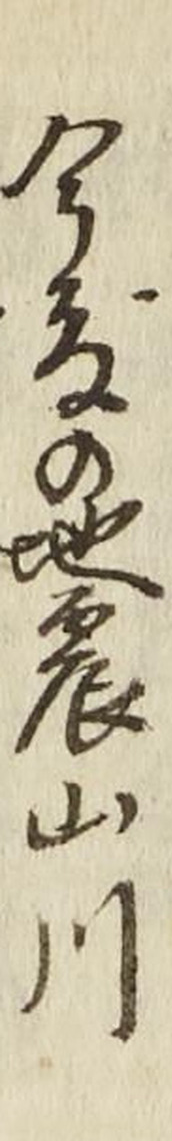今度の地震山川
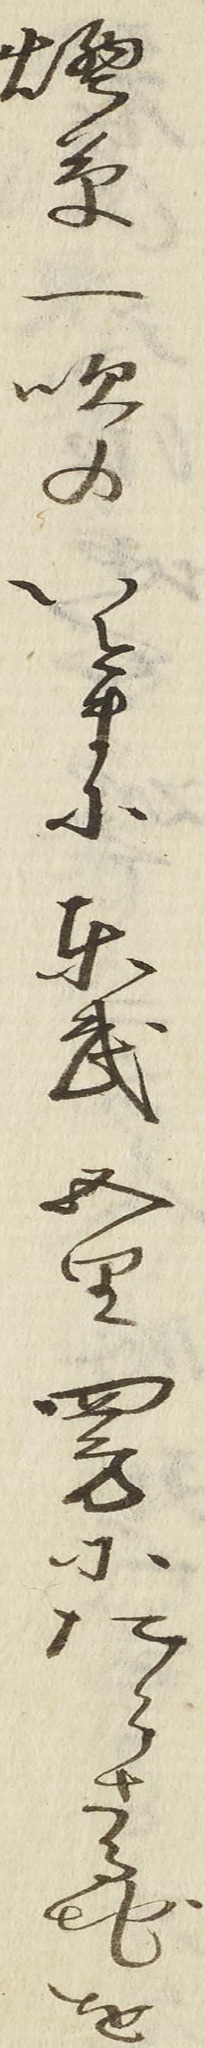煙草一吹のいとまに東武五里四方にたらさる地を
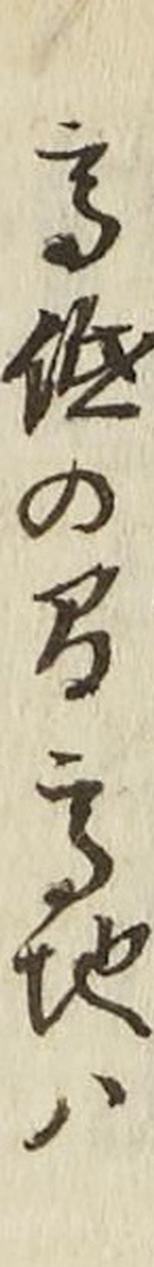高低の間高地は
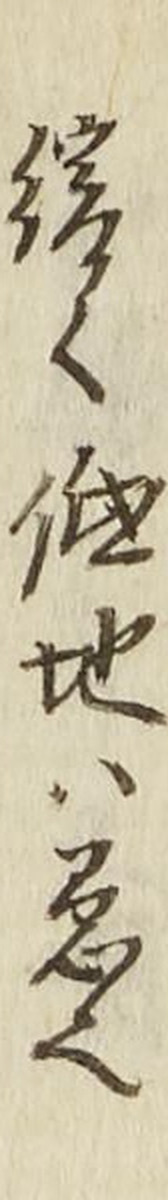緩く低地は急也
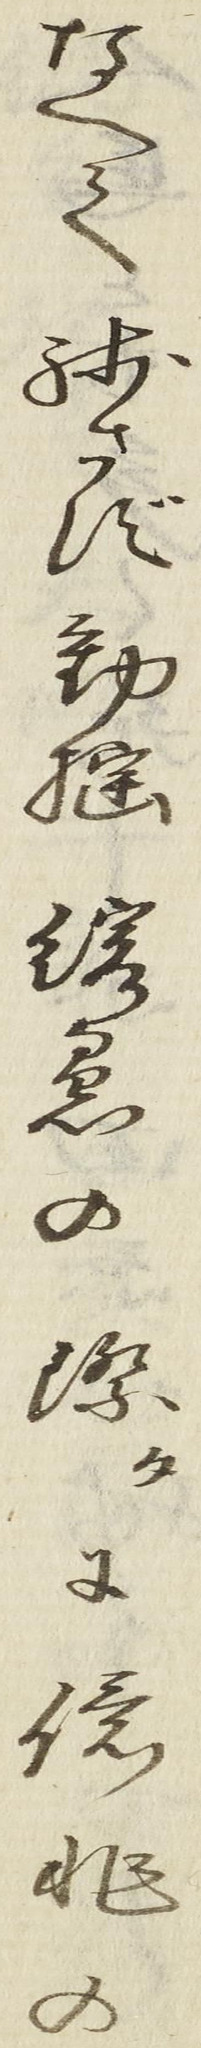なへて残さず動揺緩急の際億兆の
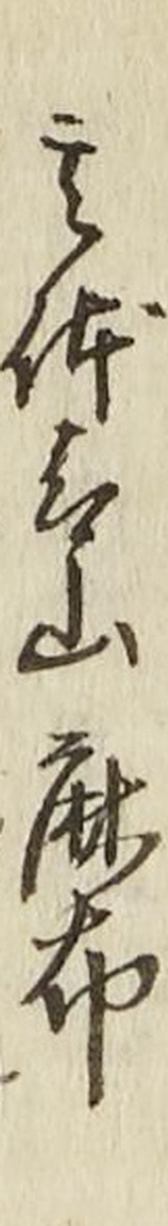其体青山麻布
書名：やぶれ窓の記　全
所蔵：東京大学地震研究所図書室 Earthquake Research Institute Library, The University of Tokyo, JAPAN
